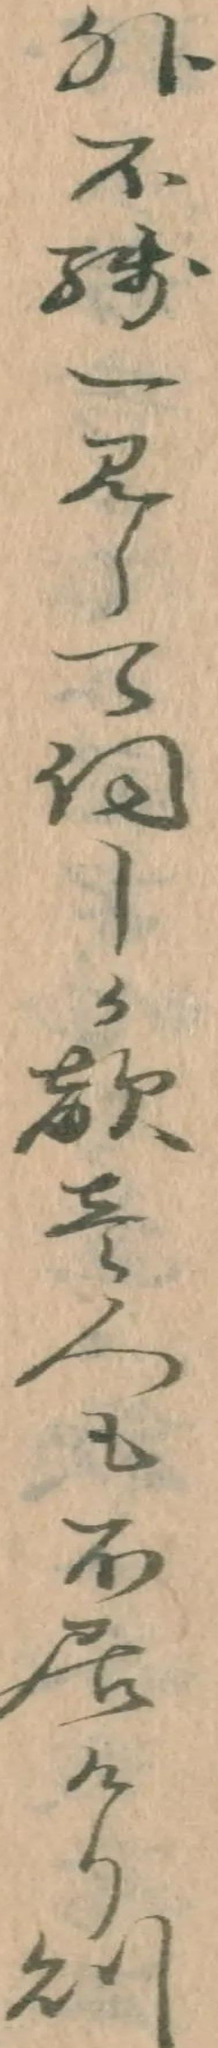外不残一見して伺しか敵壱人も不居けり則
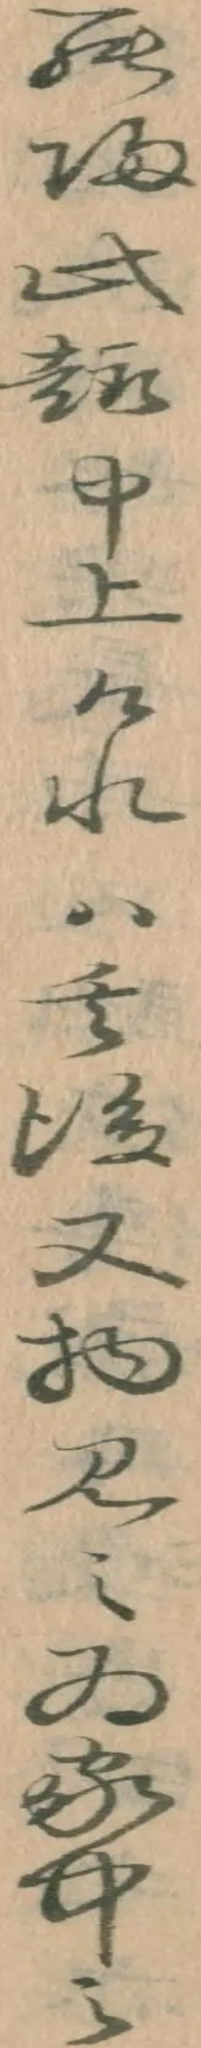罷帰此趣申上けれは其後又物見之ゐ家中之
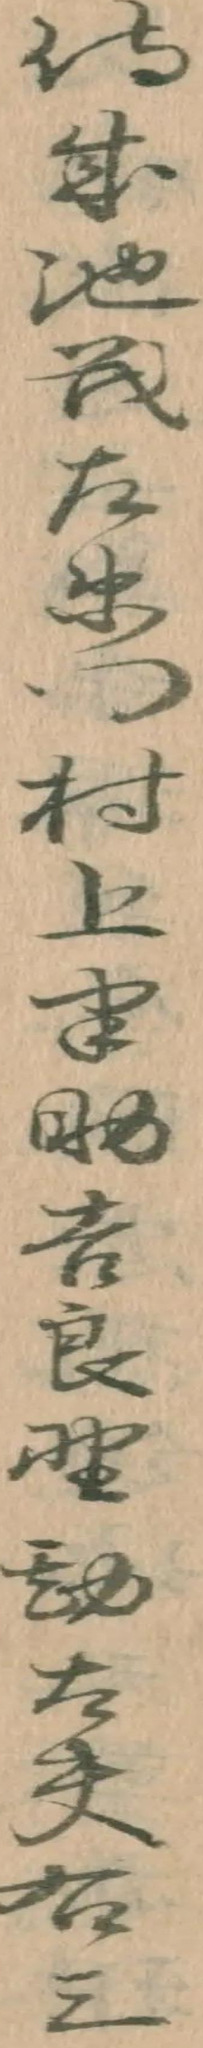侍成池茂佐衛門村上半助吉良野勘太夫右三
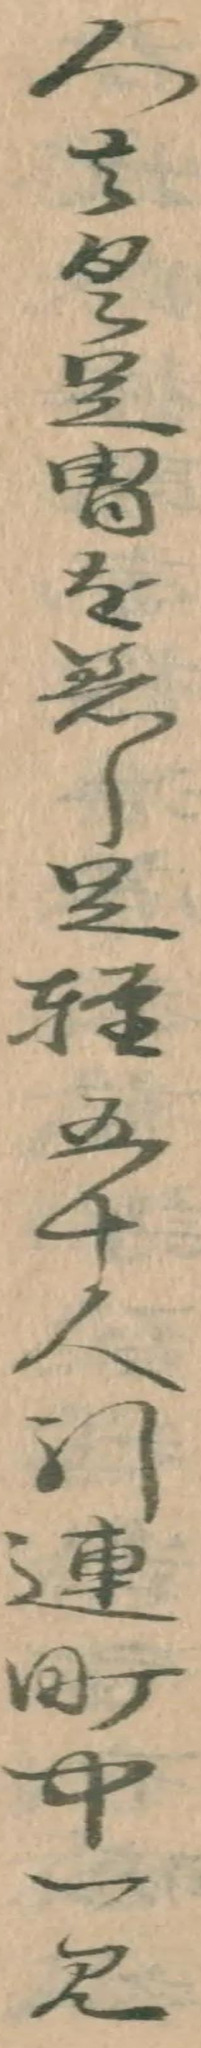人者具足冑を着し足軽五十人引連町中一見
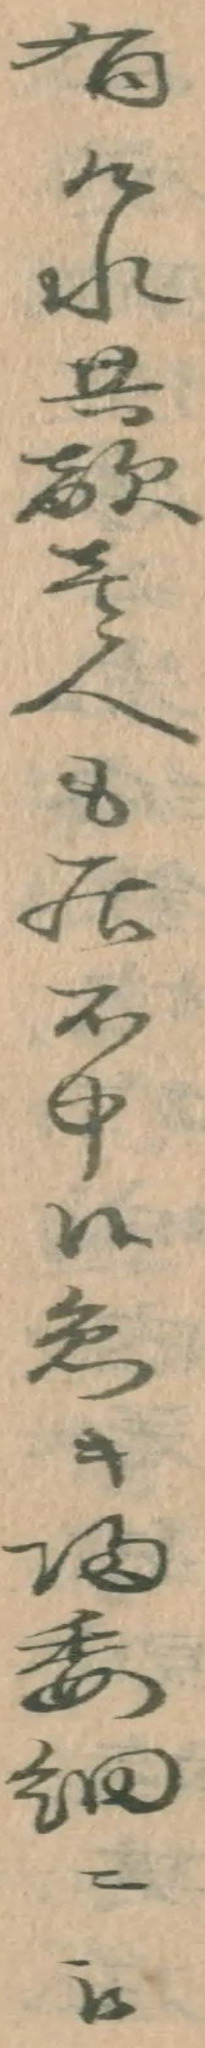有けれ共敵壱人も居不申候急き帰委細に被
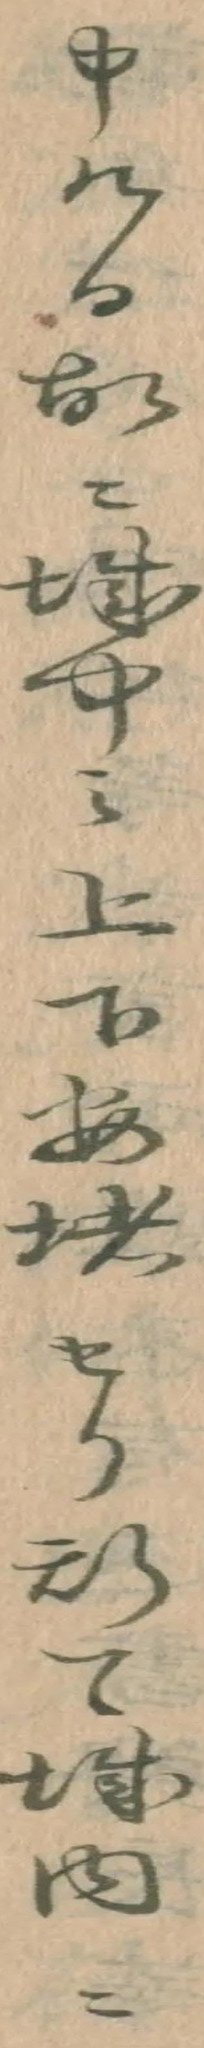申ける故に城中之上下安堵せり斯て城内に
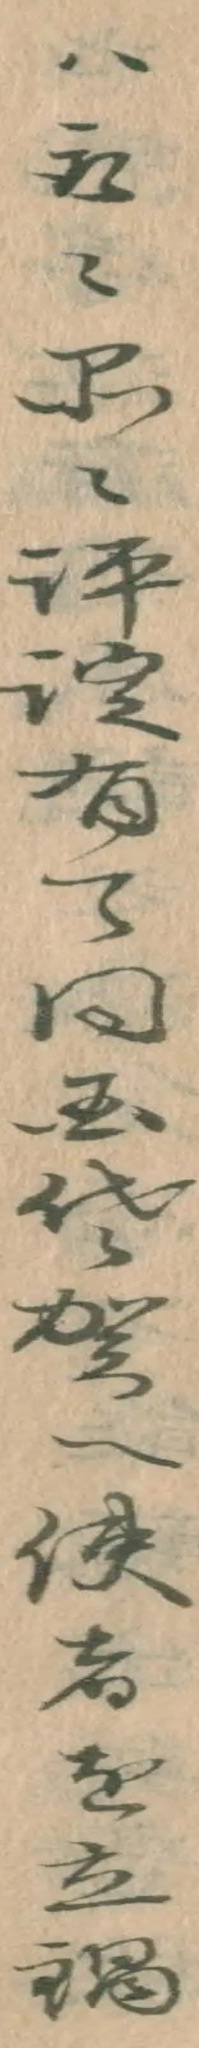は取々早々評諚有て同国佐賀へ使者を立鍋
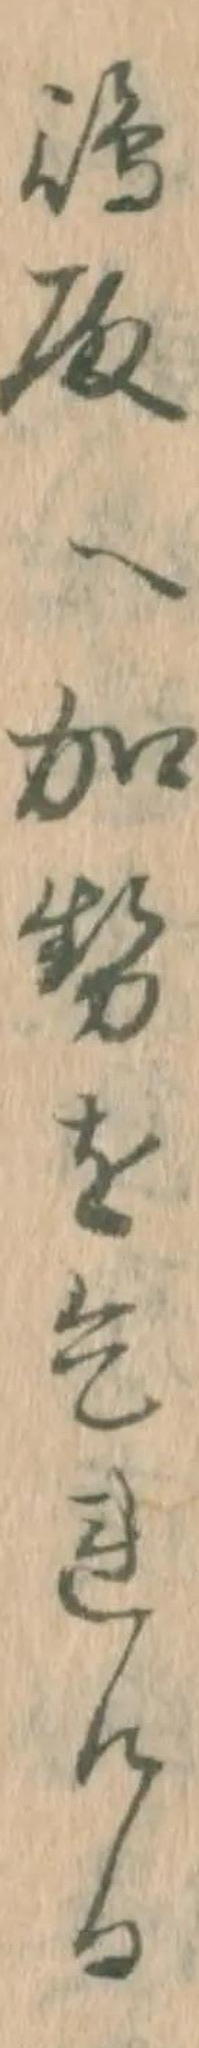島殿へ加勢を乞連ける
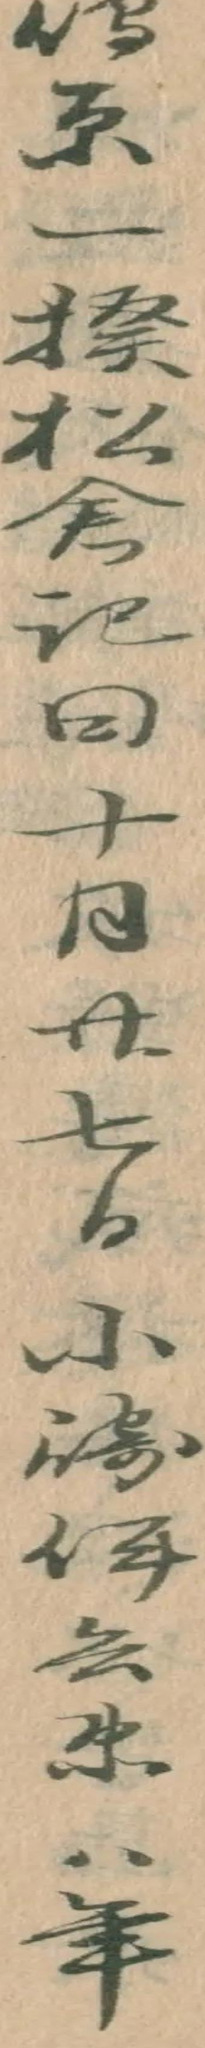島原一揆松倉記曰十月廿七日小崎伊兵衛は年
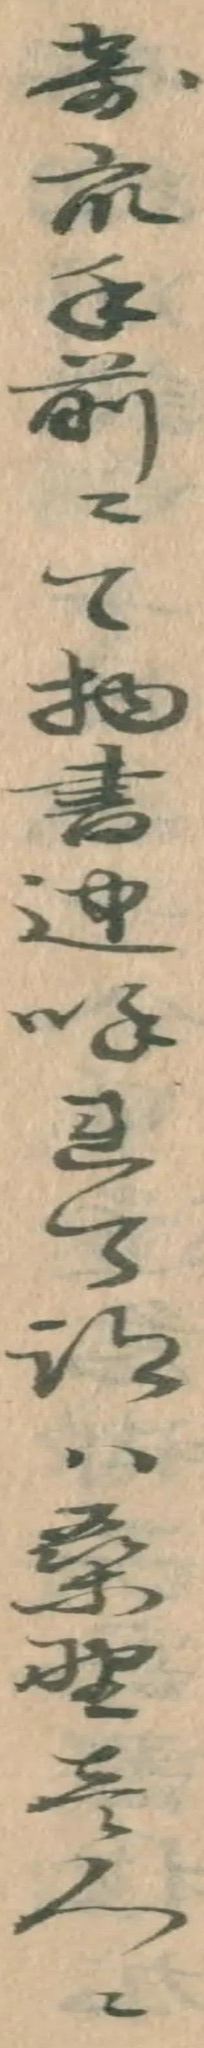寄衆手前にて物書迚呼連て跡は桑野壱人に
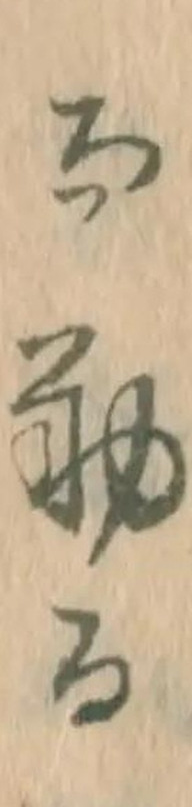而勤る

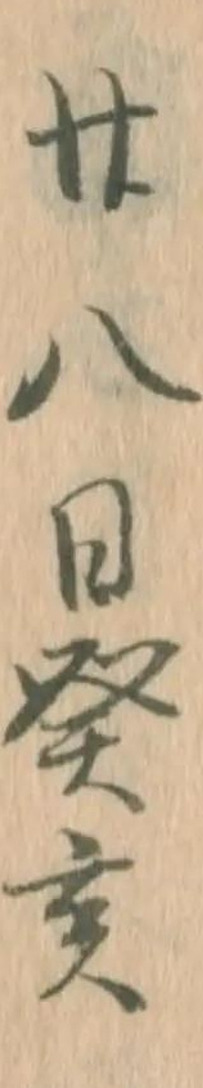廿八日癸亥
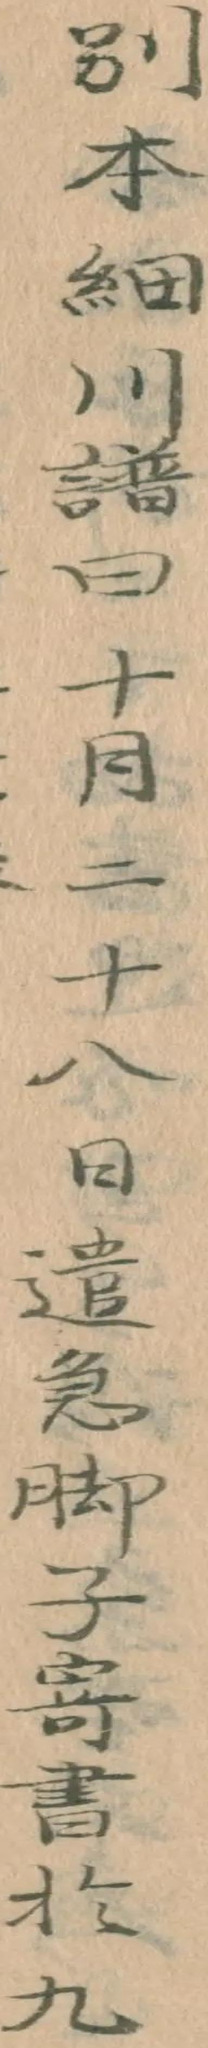別本細川譜曰十月二十八日遣急脚子寄書於九
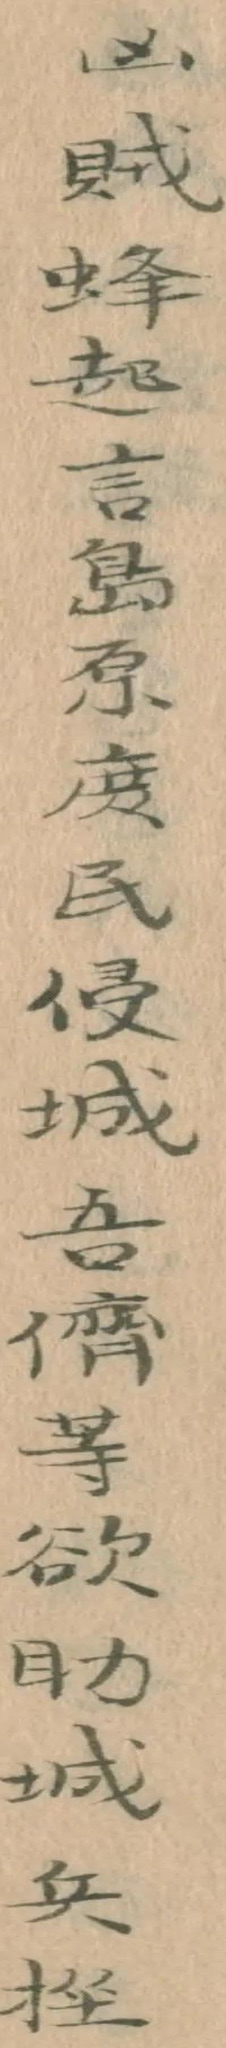凶賊蜂起言島原度民侵城吾儕等欲助城兵挫
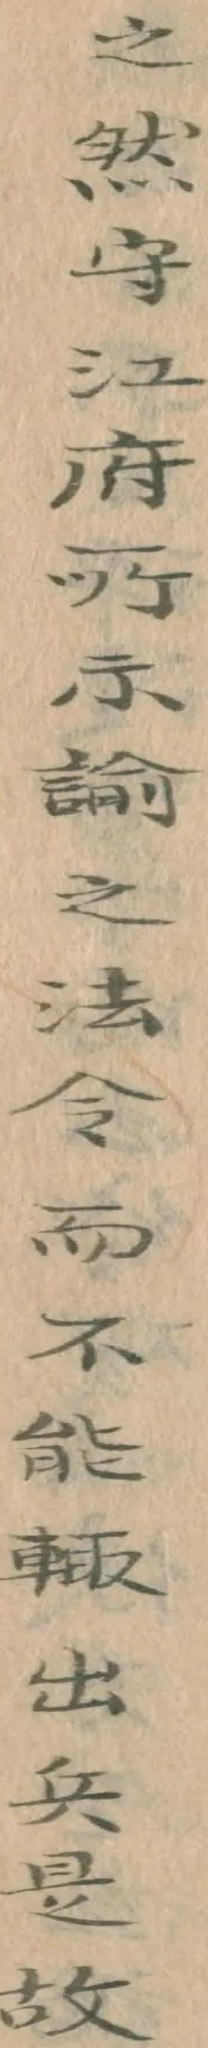之然守江府所示諭之法令而不能輙出兵是故
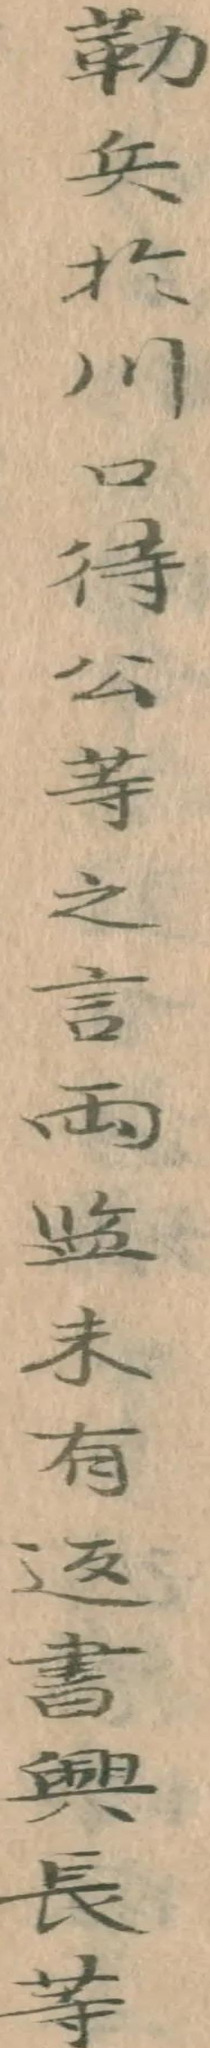勒兵於川口待公等之言両監未有返書興長等
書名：切支丹御退治記 49巻. [2]
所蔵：国立国会図書館 National Diet Library, JAPAN
